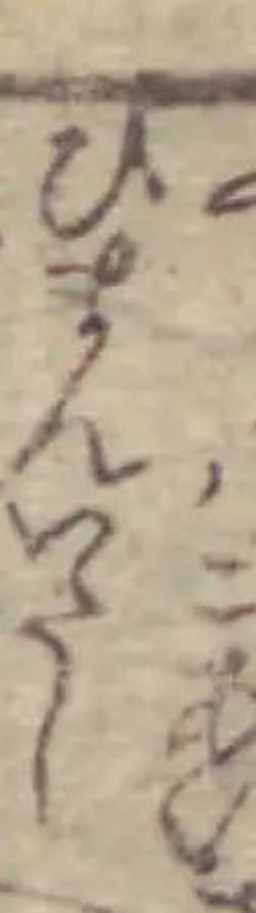ひまんいたし
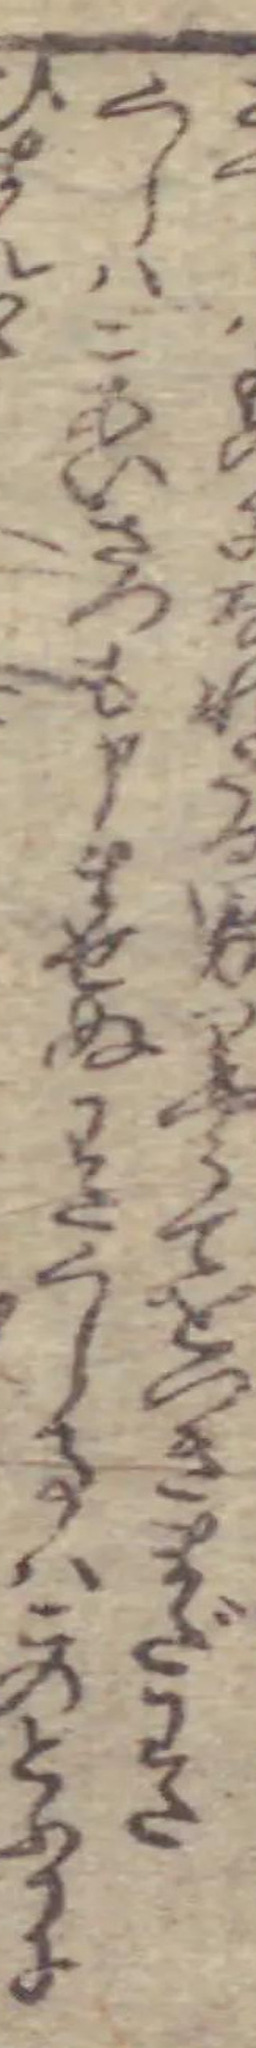くしはごあいさつも申ませぬわたくし事はこのとうふりに
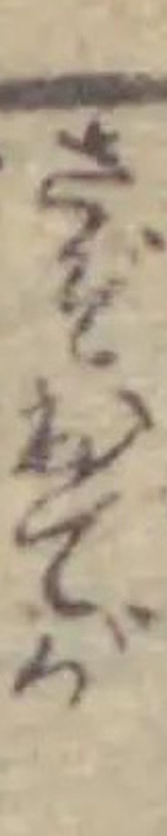さぞおてが
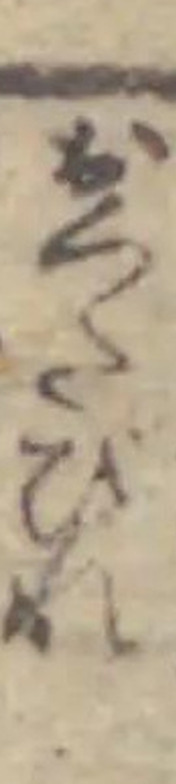おくたびれ
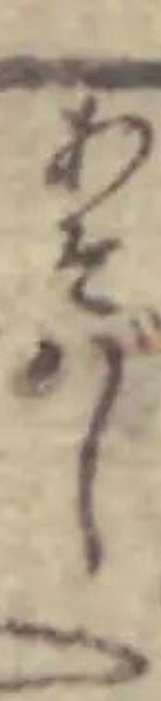あそばし
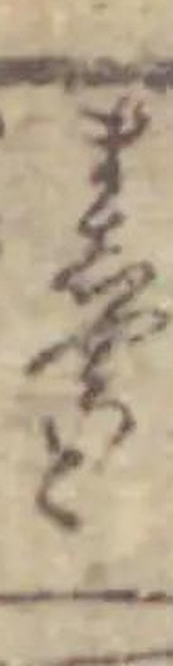ましやうと
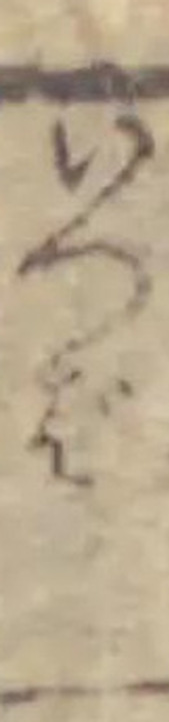いへば
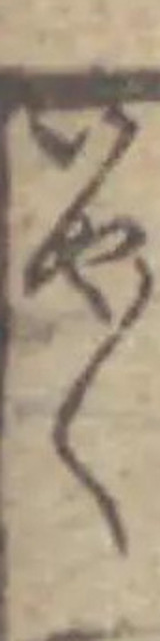いや〳〵
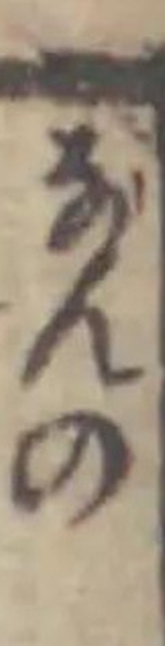なんの
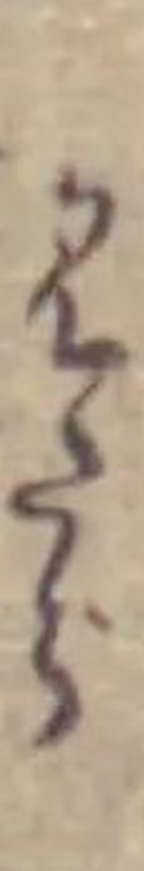見たら
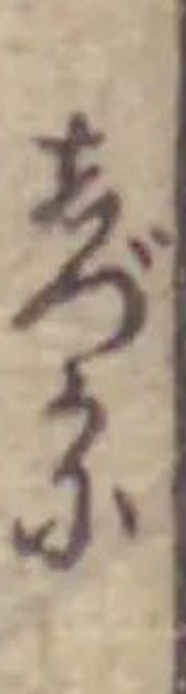しづかに
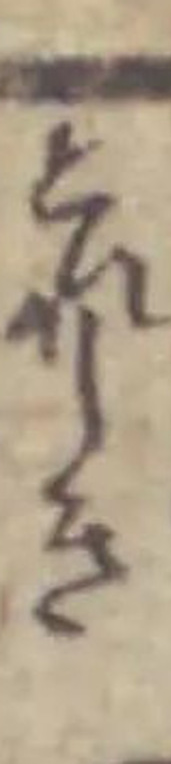これしき
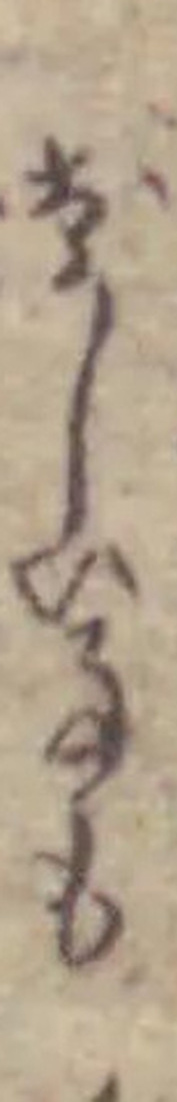おかしい事も
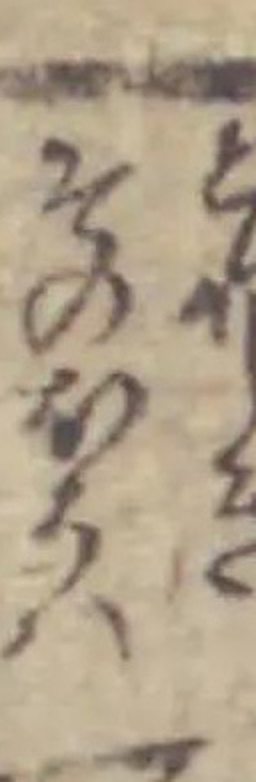そのほうは
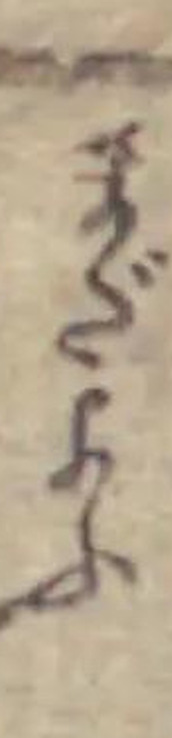まだよふ
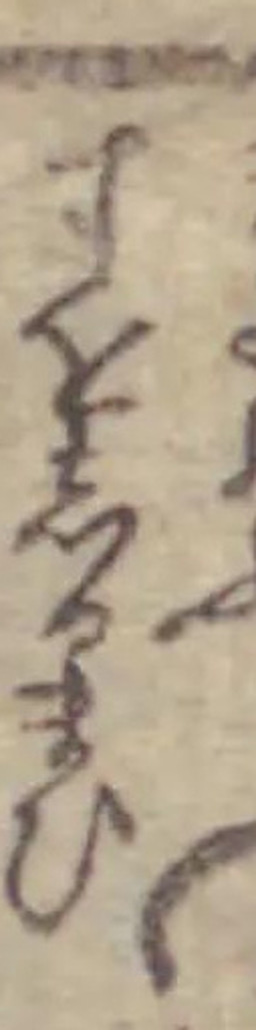すをしるまひ
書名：珍説女天狗 2巻
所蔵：国立国会図書館 National Diet Library, JAPAN
